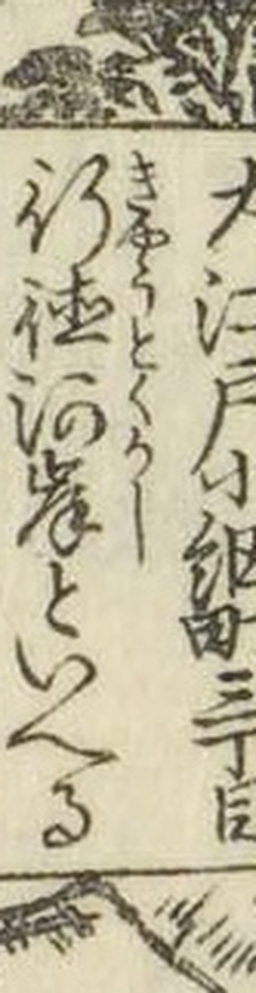行徳河岸といへる
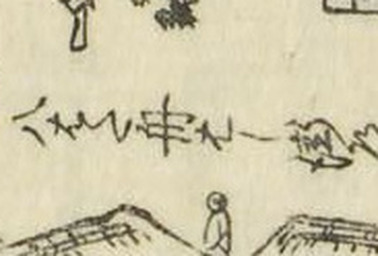八はた舟はし街道
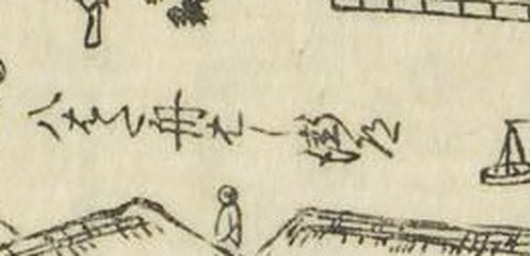八はた舟はし街道
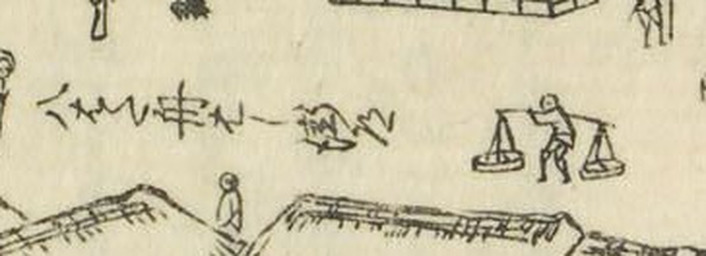八はた舟はし街道
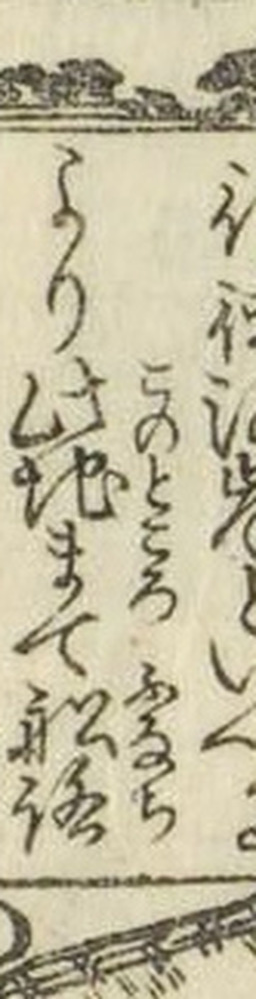より此地まて船路
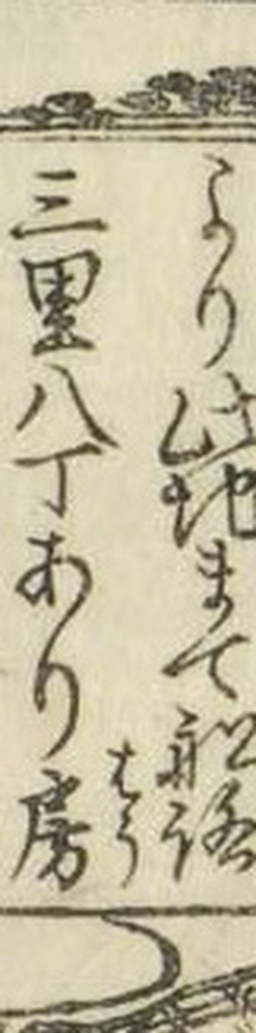三里八丁あり房
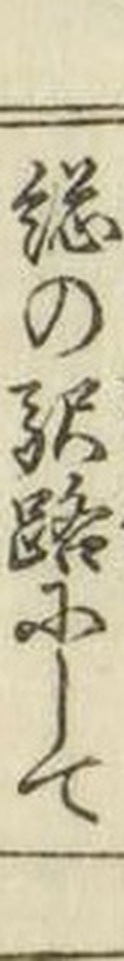総の駅道にして
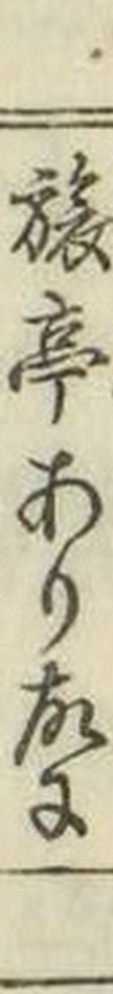旅亭あり故に
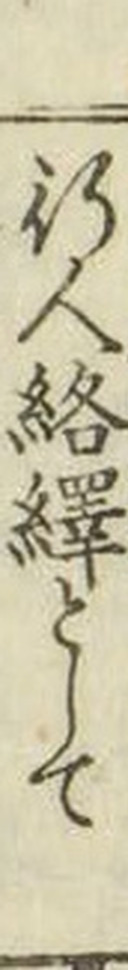行人絡繹として
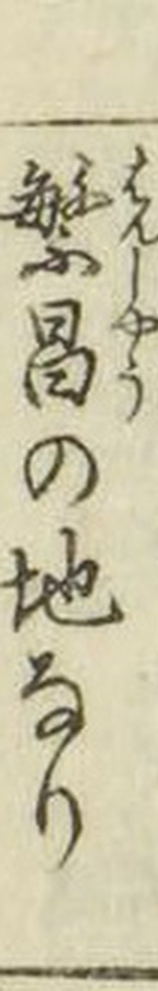繁昌の地なり
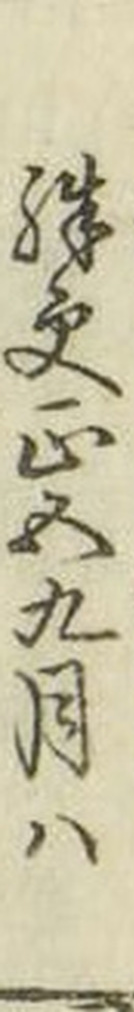殊更正五九月は
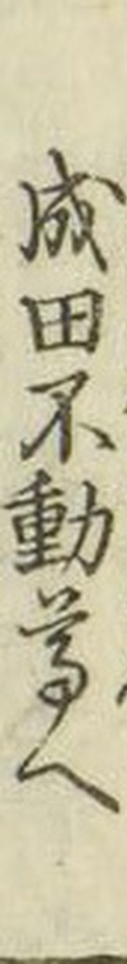成田不動尊へ
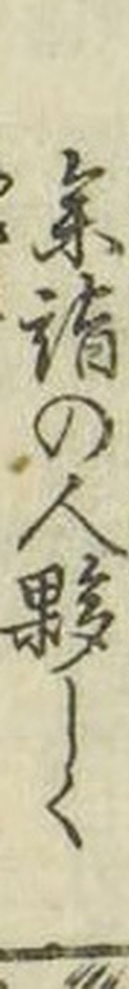参詣の人夥しく
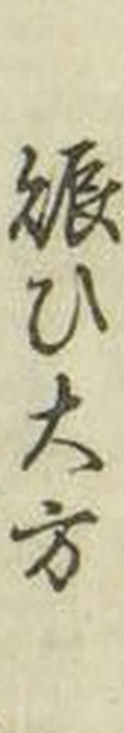賑ひ大方
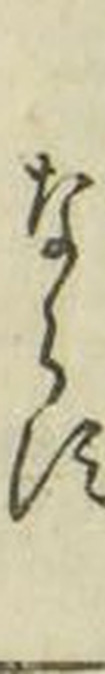ならす

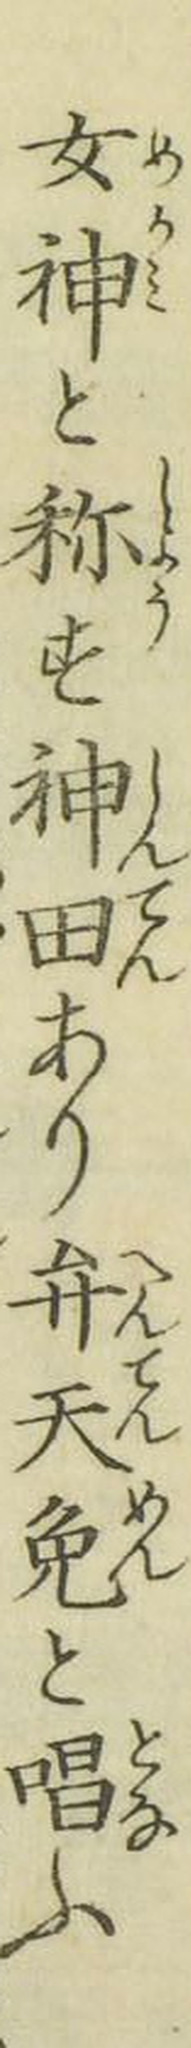女神と称す神田あり弁天免と唱ふ
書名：江戸名所図会 20巻 巻之20
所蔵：東京学芸大学教育コンテンツアーカイブ
